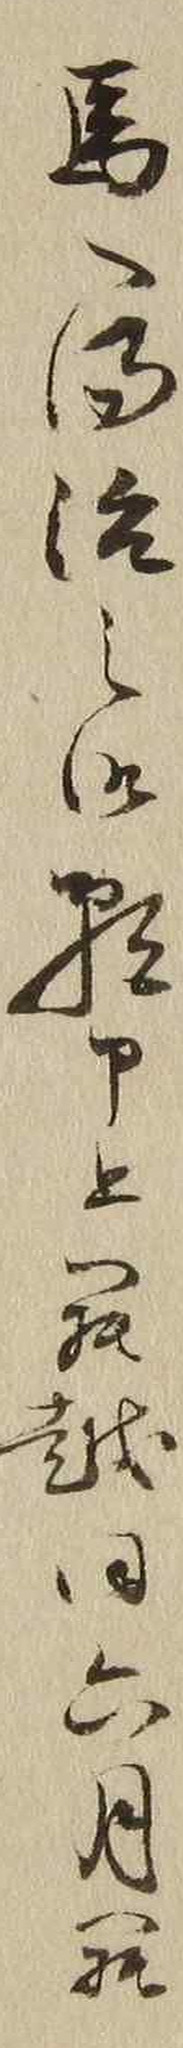馬へ湯治之御願申上罷越同六月罷
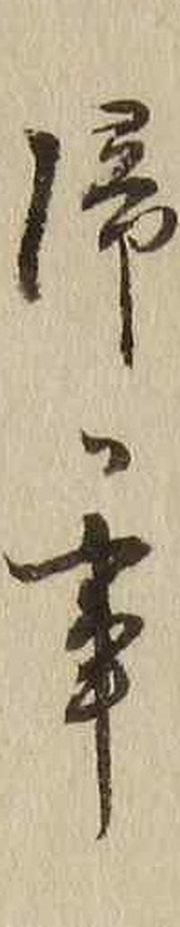帰候事
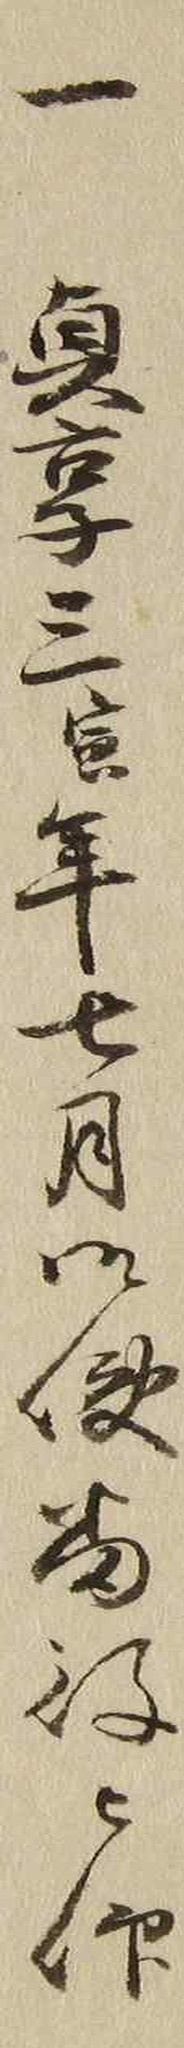一貞享三寅年七月御使番役被仰
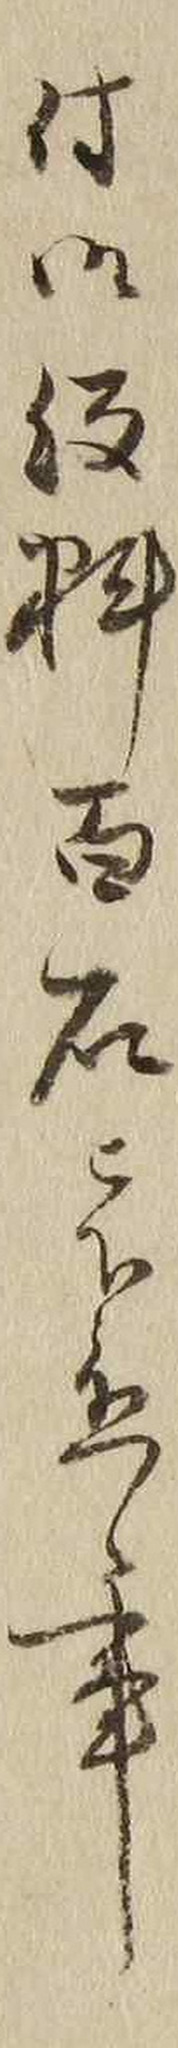付御役料百石被下置候事
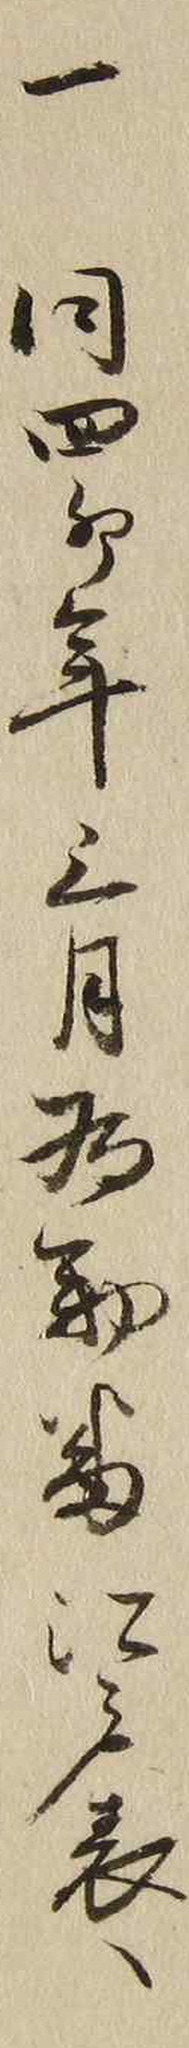一同四卯年三月為勤番江戸表へ
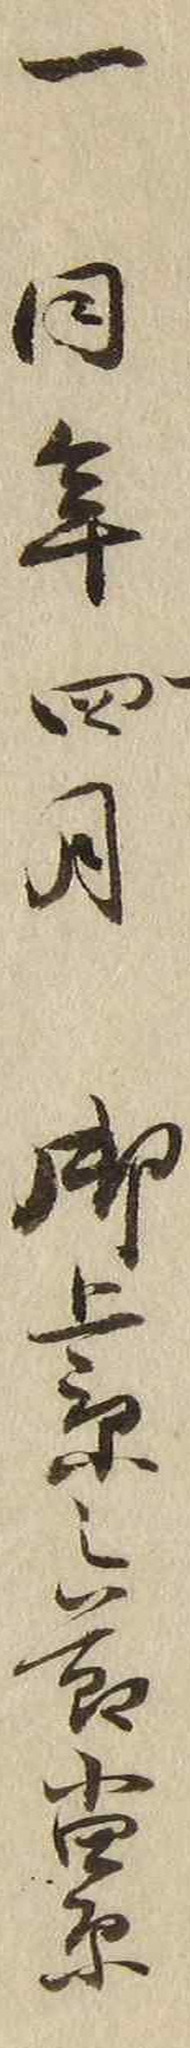一同年四月御上京之節小田原
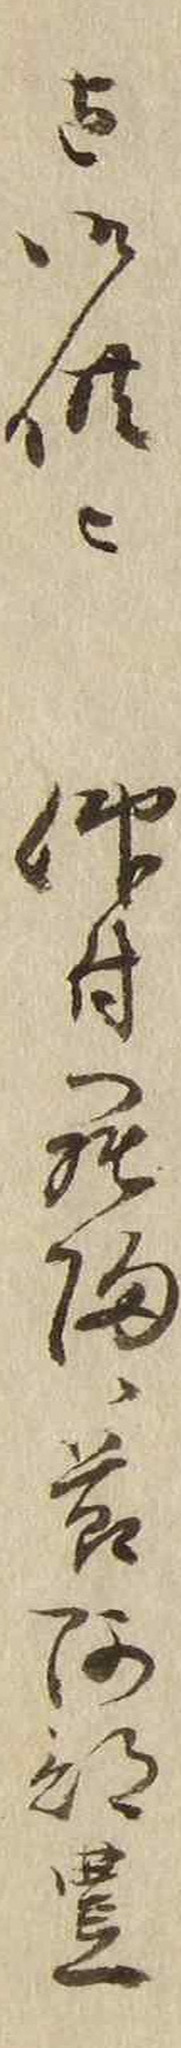迄御供被仰付罷帰候節阿部豊

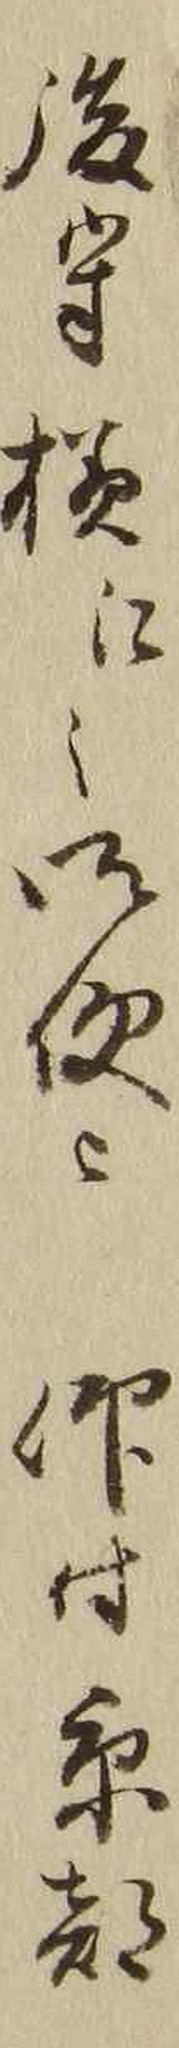後守様江之御使被仰付京都
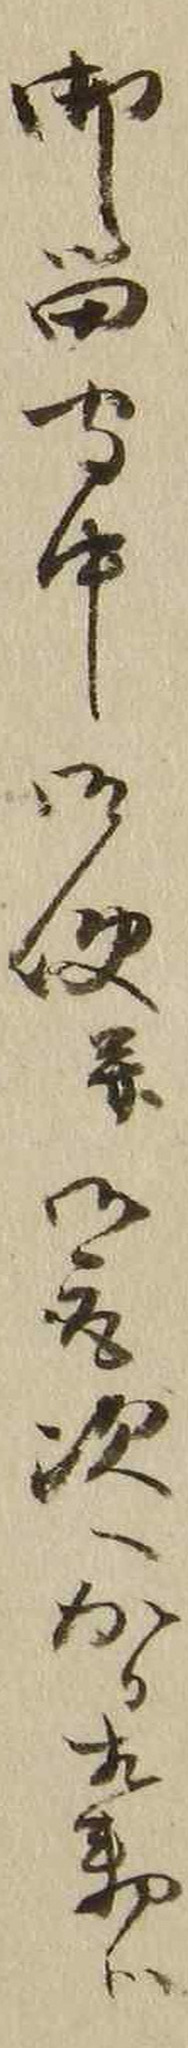御留守中御使并御取次へ加り相勤候
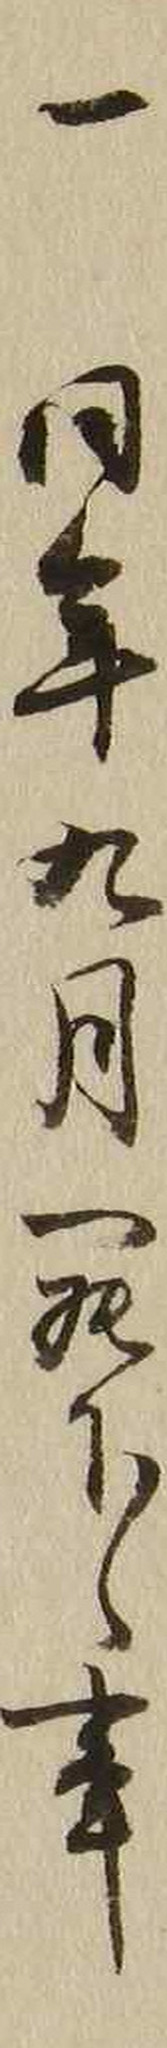一同年九月罷下候事
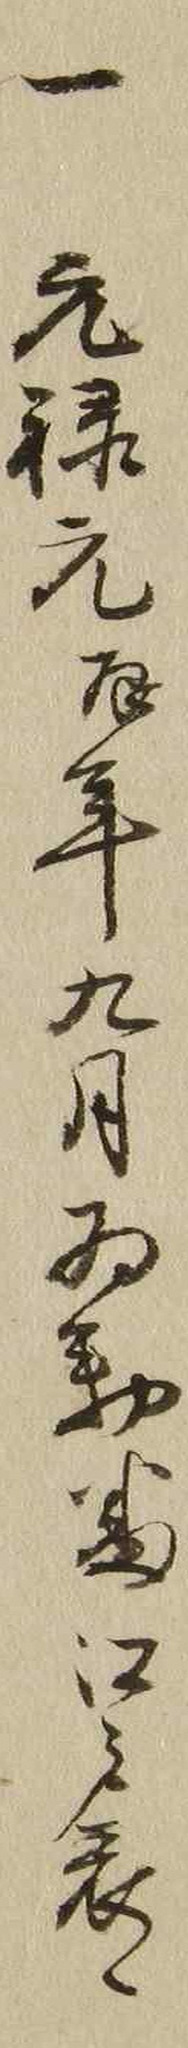一元禄元辰年九月為勤番江戸表へ
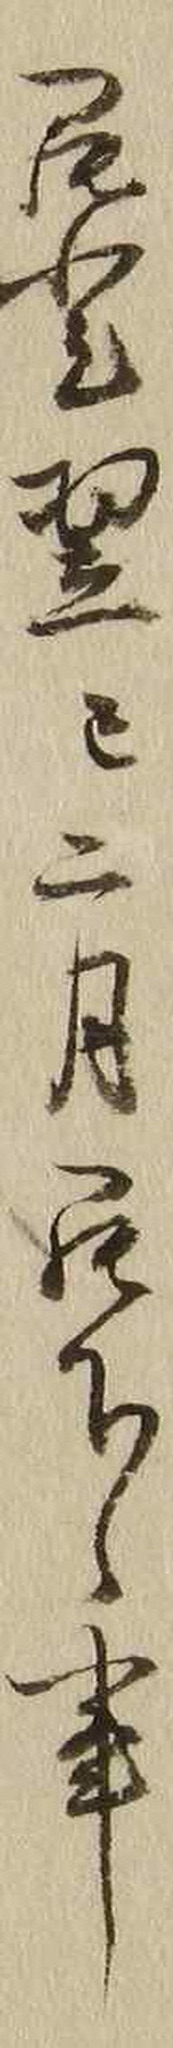罷登翌巳二月罷下候事
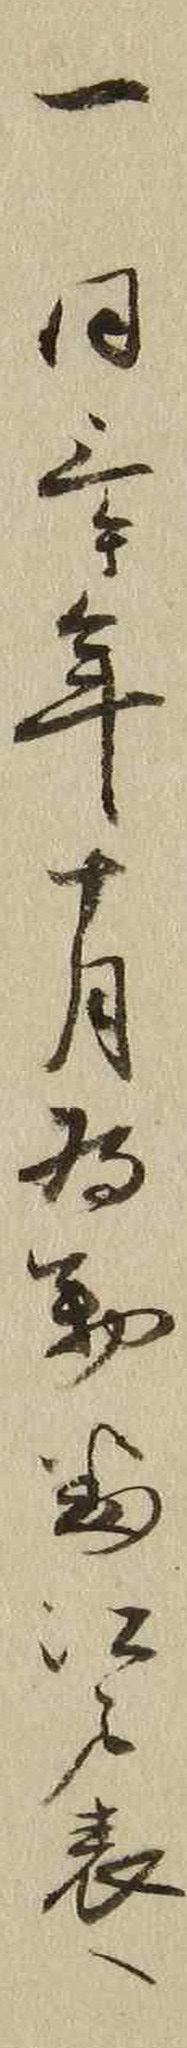一同三午年十月為勤番江戸表へ
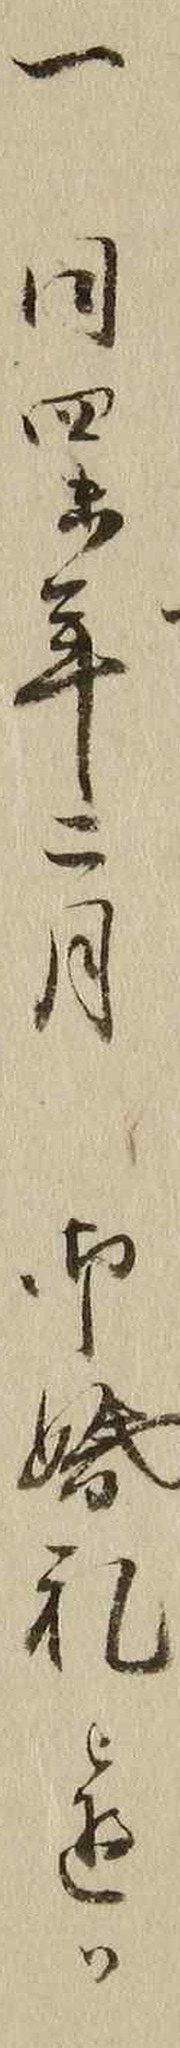一同四未年二月御婚礼被遊候
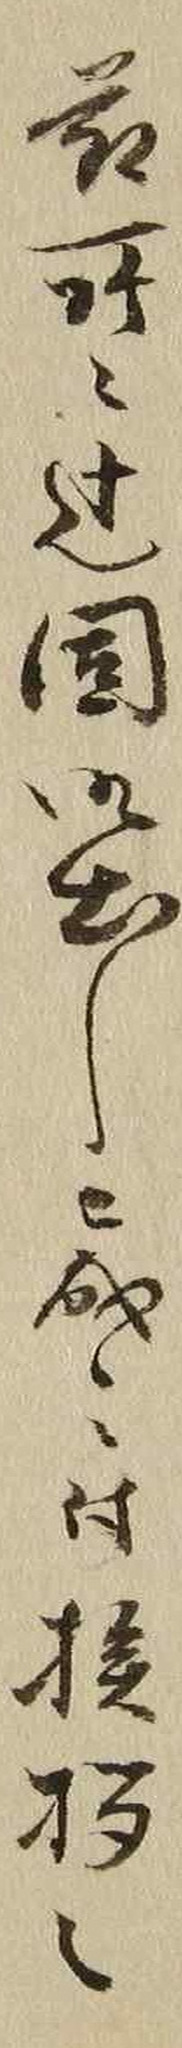節所々辻固御出し被成候ニ付挨拶之
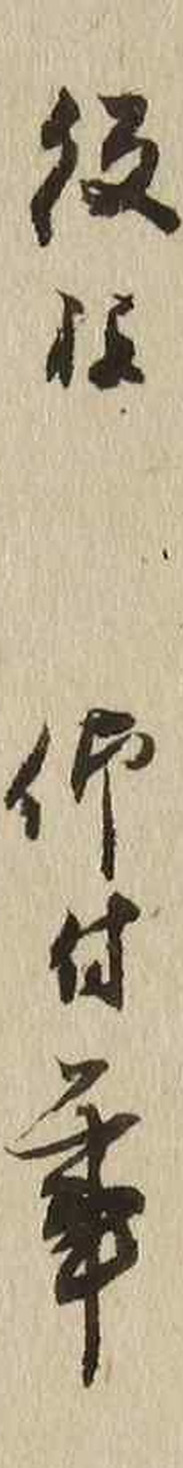使被仰付候
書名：諸士系譜　巻之225　ま之部6
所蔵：会津若松市立会津図書館
